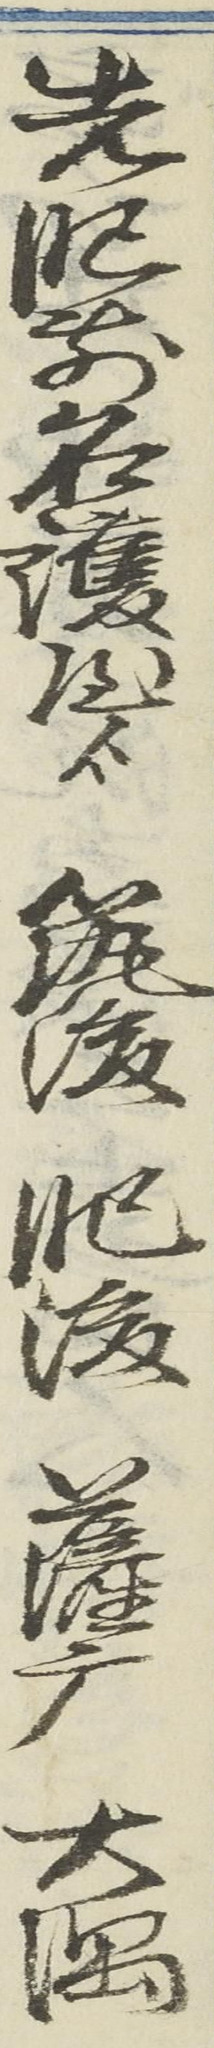先肥前名護屋ゟ筑後肥後薩摩大隅
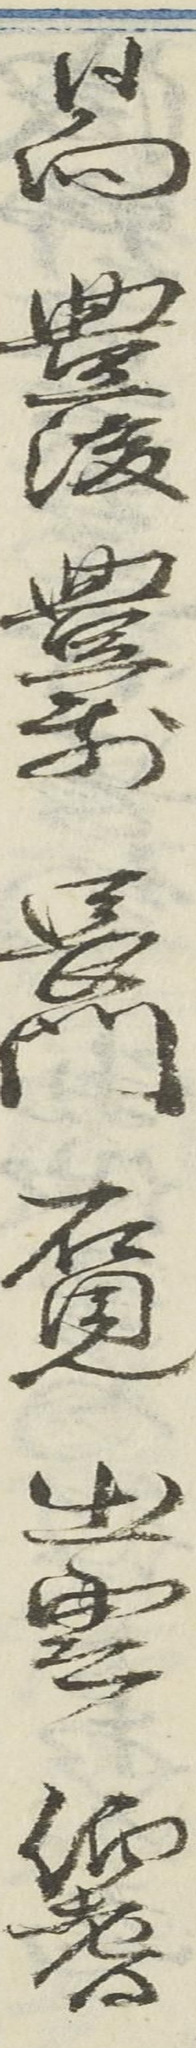日向豊後豊前長門石見出雲伯耆
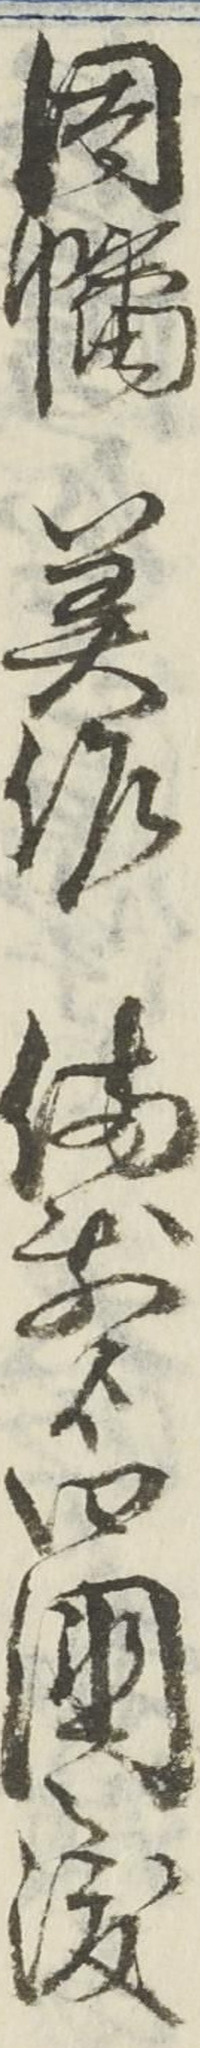因幡美作備前ゟ四国ニ後
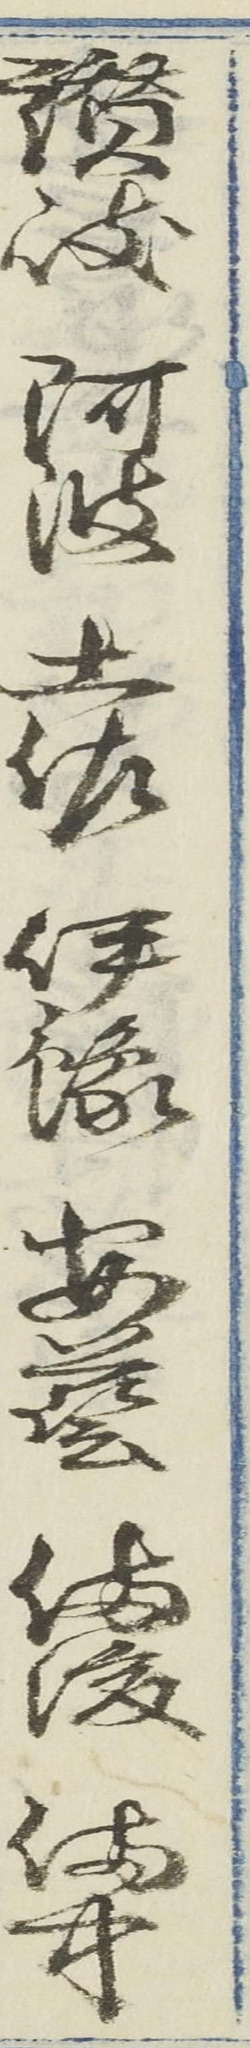讃岐阿波土佐伊豫安藝備後備中
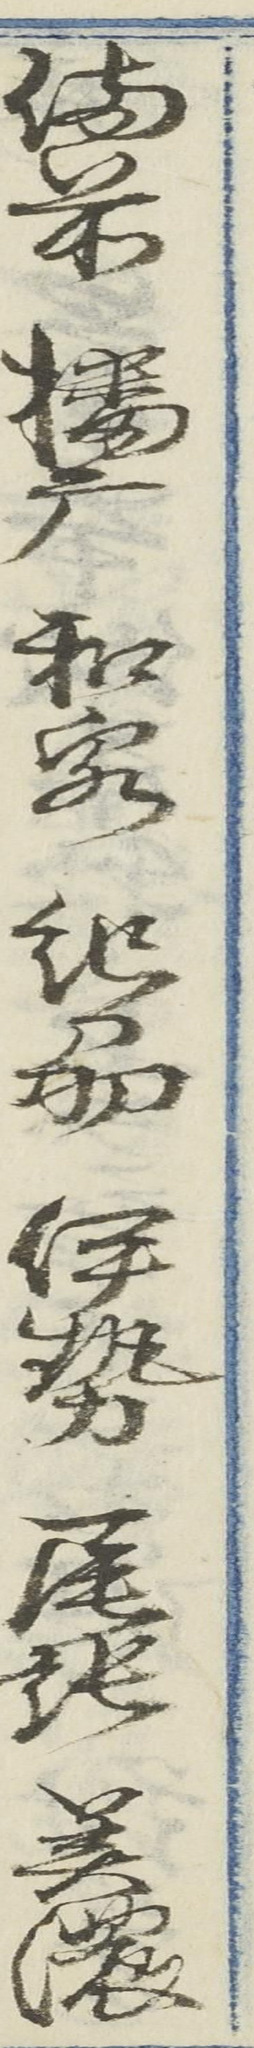備前播磨和泉紀州伊勢尾張美濃
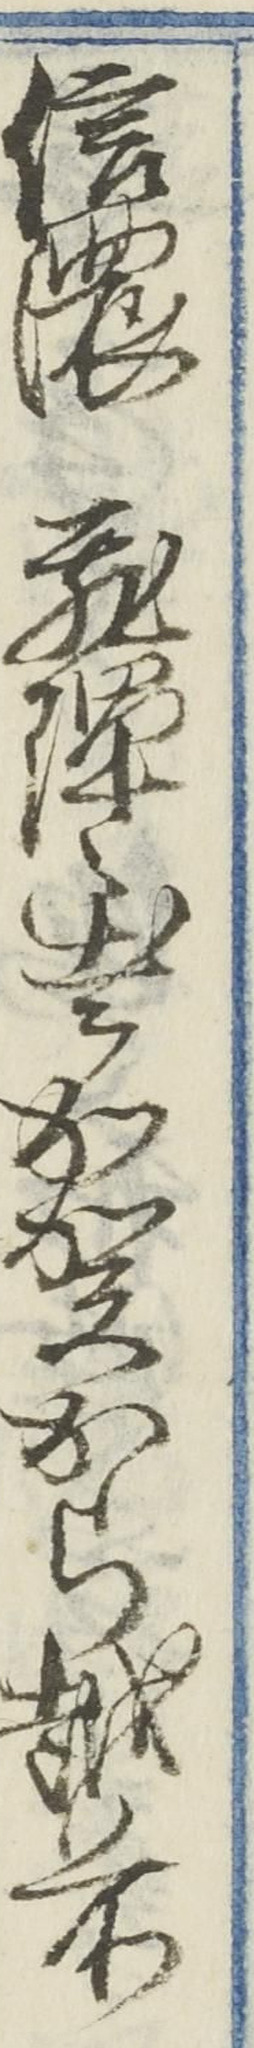信濃飛騨ニ出テ加賀から越前
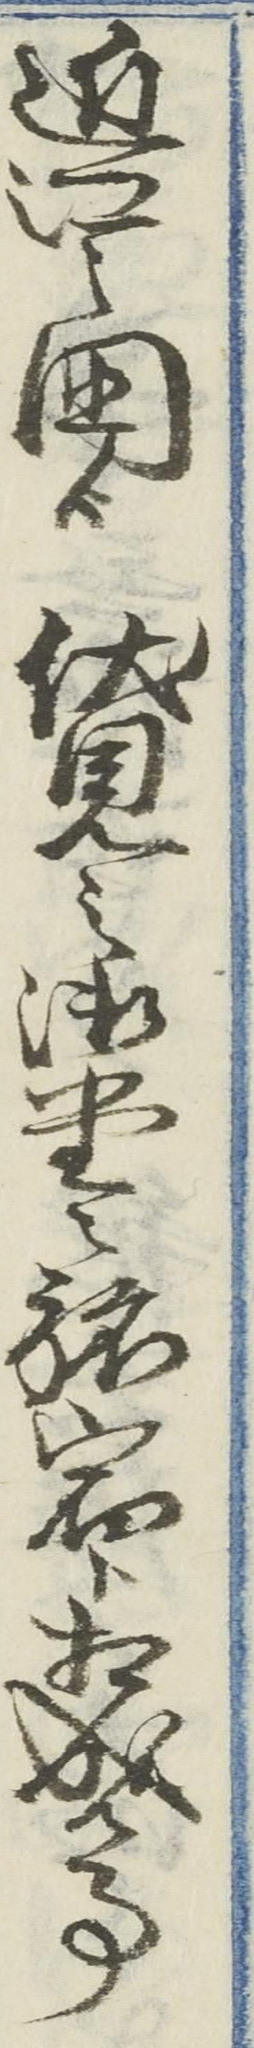近江之国ゟ伏見之御堂ニ旅宿ト相成ル事
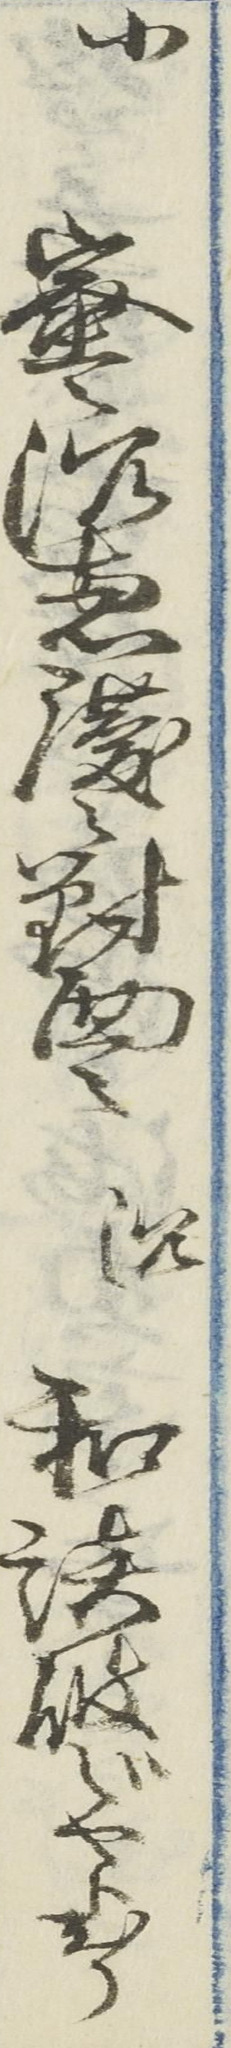小密ニ沈恵慶ニ対面也沈和談破ジヤト云ウ
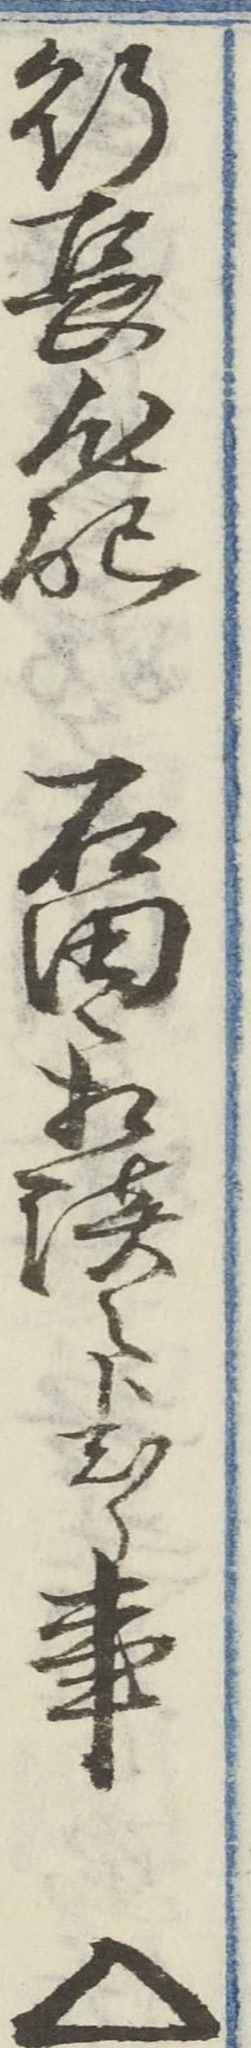行長心配石田ニ相談シト云ウ事△
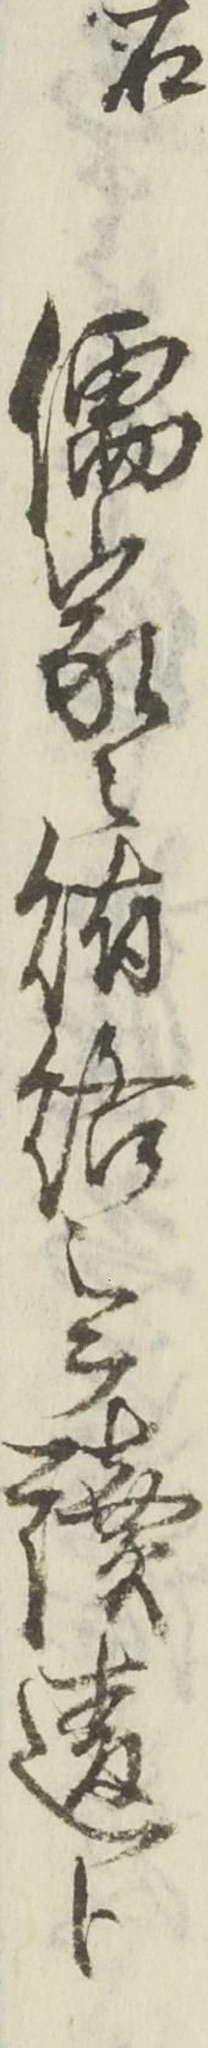石儒家ニ賄賂シテ読違ト
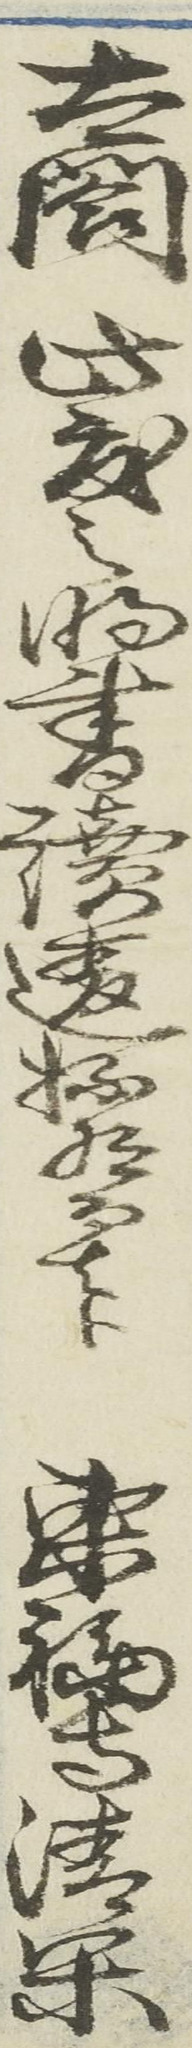太閤此度之明書読違抔有而はト東福寺清果
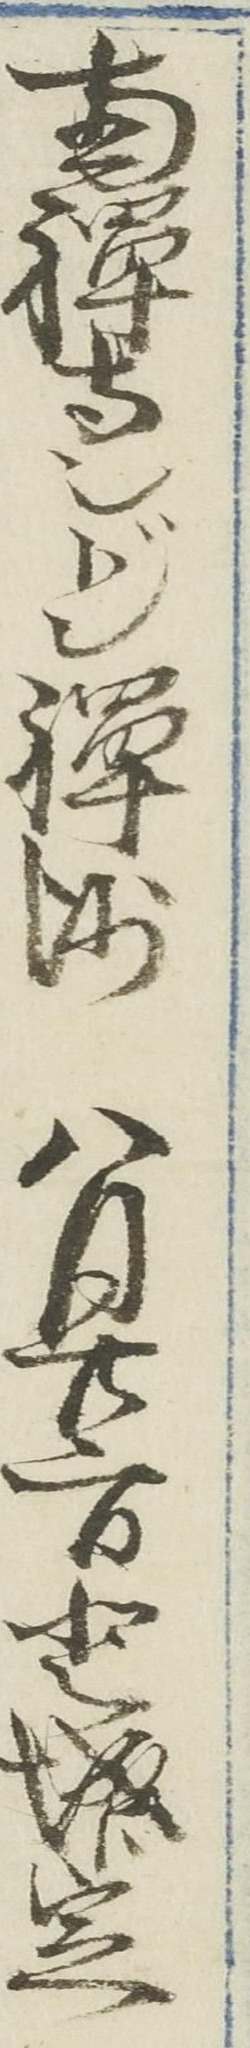南禅寺シドン禅師八月廿二日登城ト定
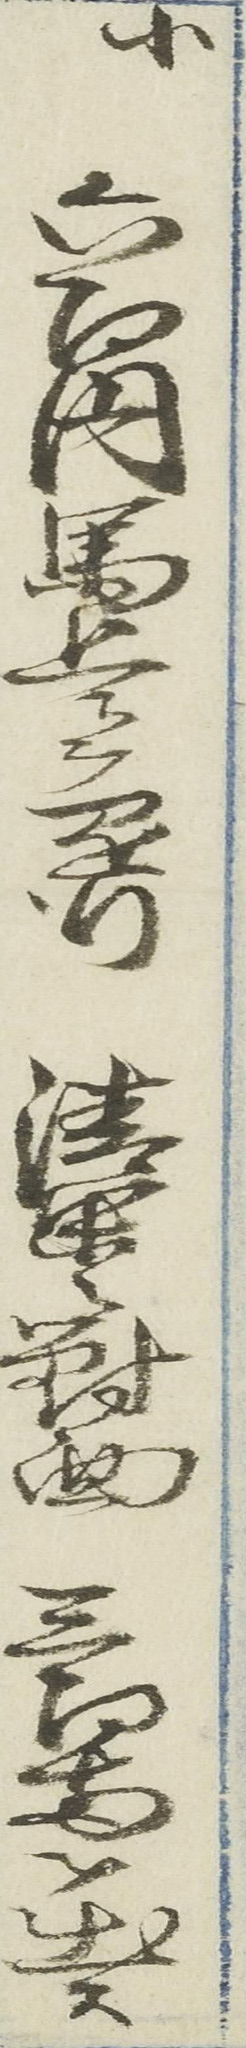小六百円馬上ニテ掛行清果ニ対面三百両ヲ出ス
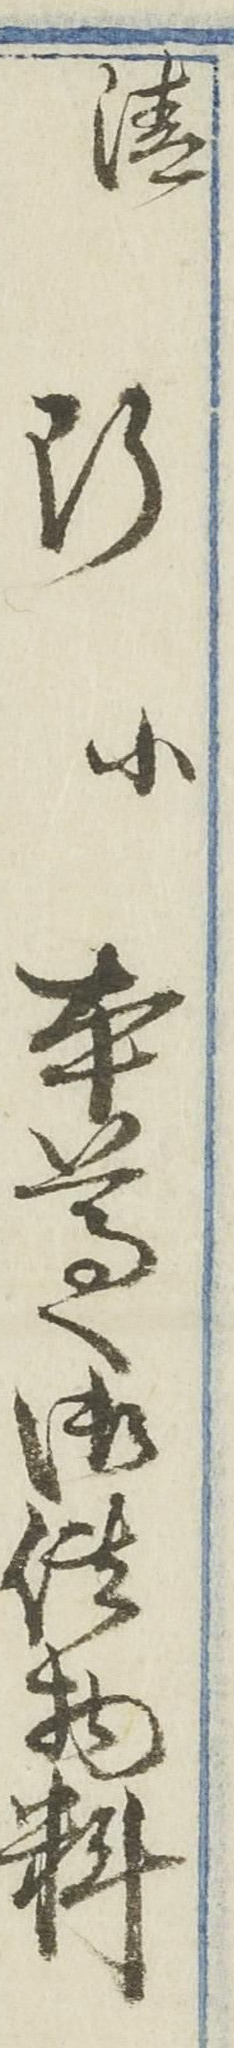清断小本尊ヘお供物料
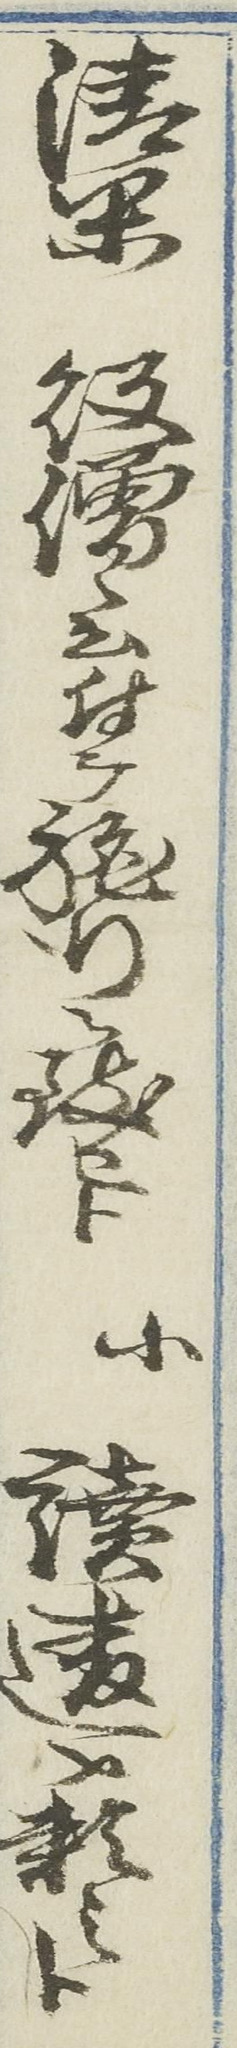清果役僧ニ云付テ施行ニ致セト小読違ヲ頼ミト
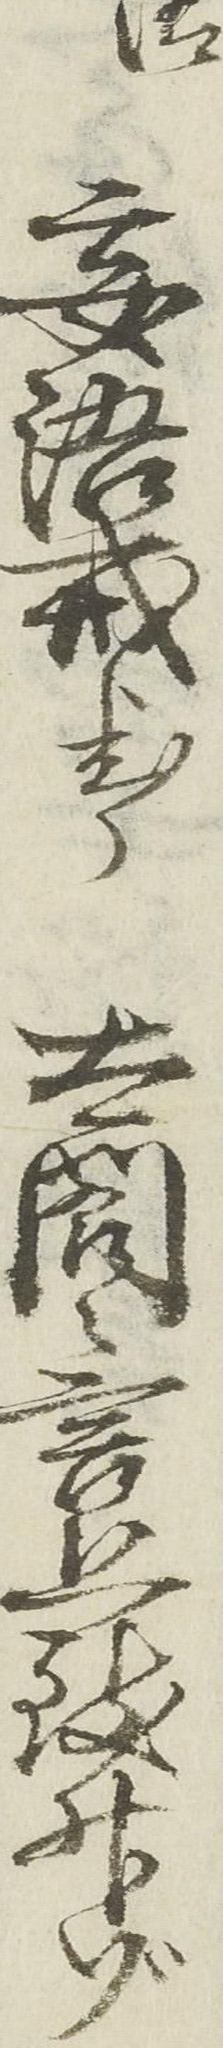清妄語戒ト云ウ太閤ニ言上致升ゾ
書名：伏水大地震
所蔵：東京大学地震研究所図書室 Earthquake Research Institute Library, The University of Tokyo, JAPAN
